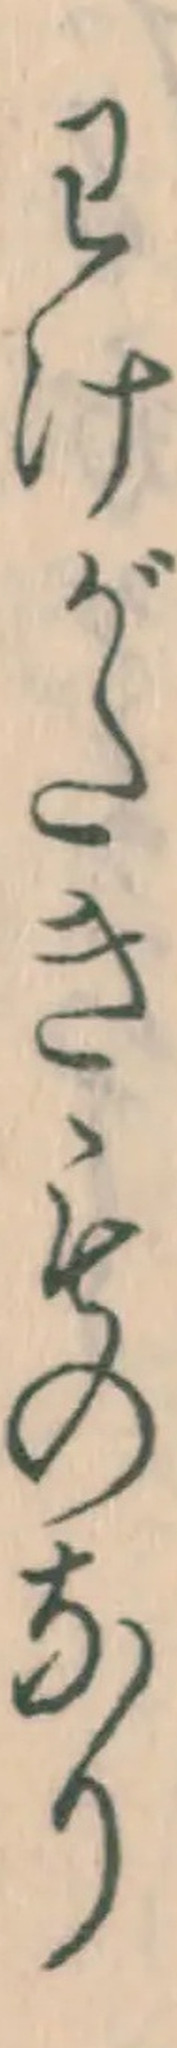わけがたきものなり
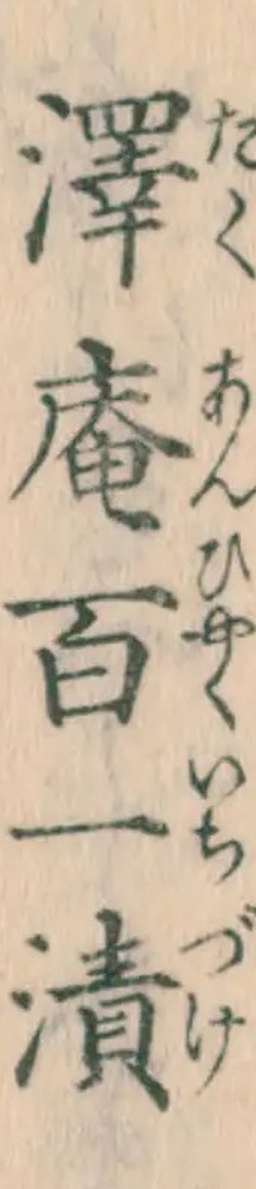沢庵百一漬
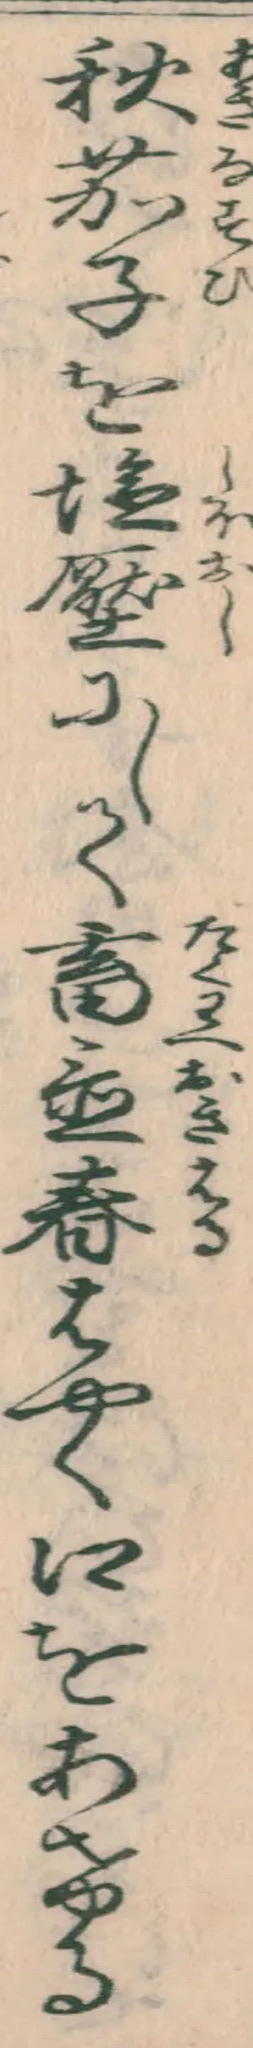秋茄子を塩圧にして畜置春はやく口をあける
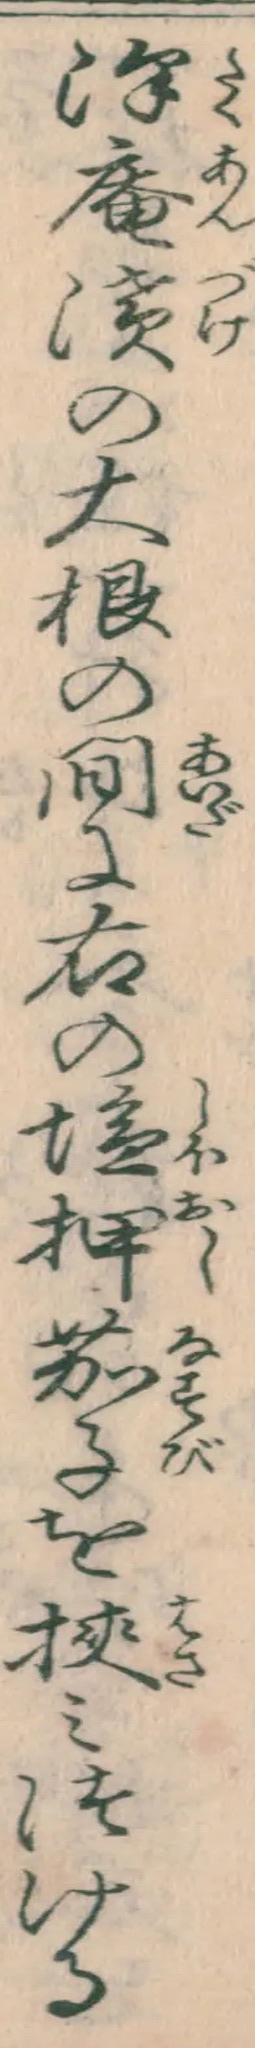沢庵漬の大根の間に右の塩押茄子を挟みつける
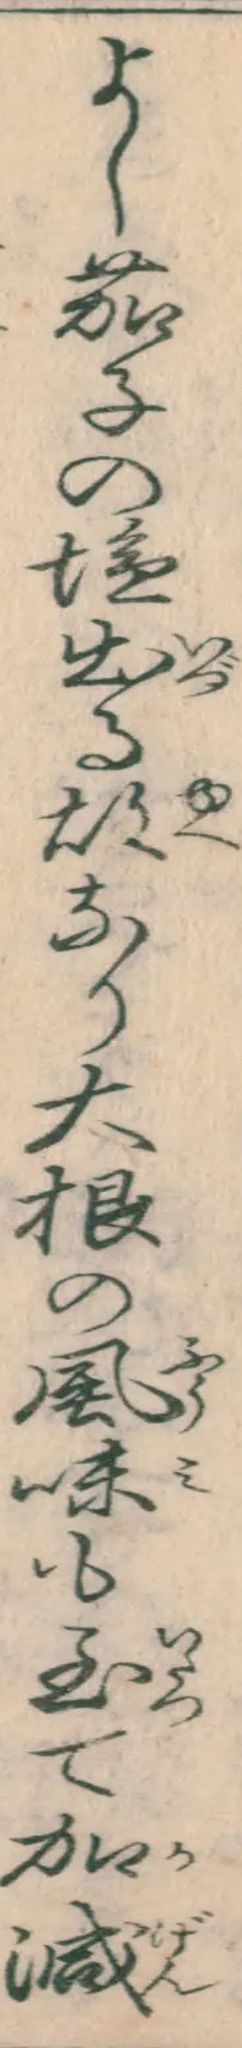よし茄子の塩出る故なり大根の風味も至て加減
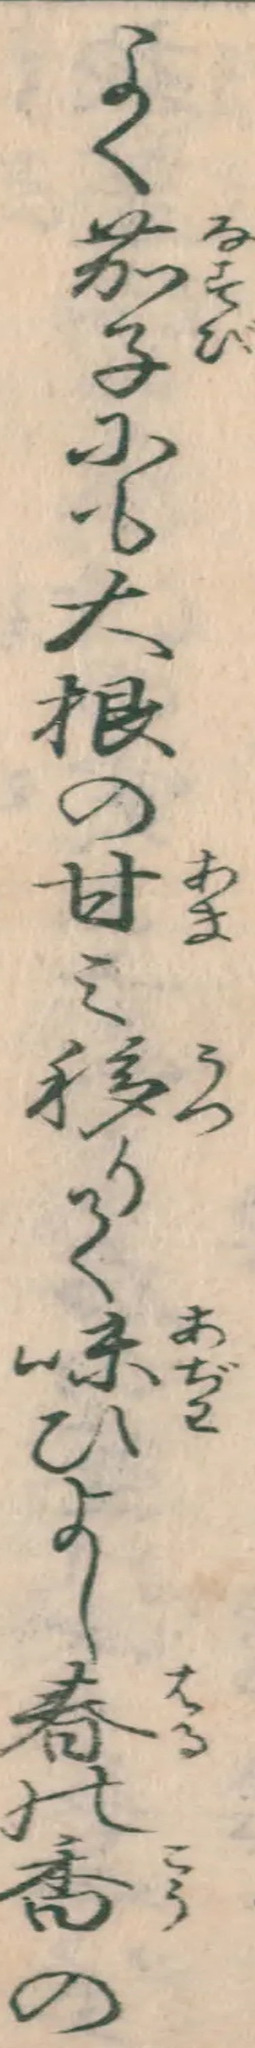よく茄子にも大根の甘み移りて味ひよし春の香の
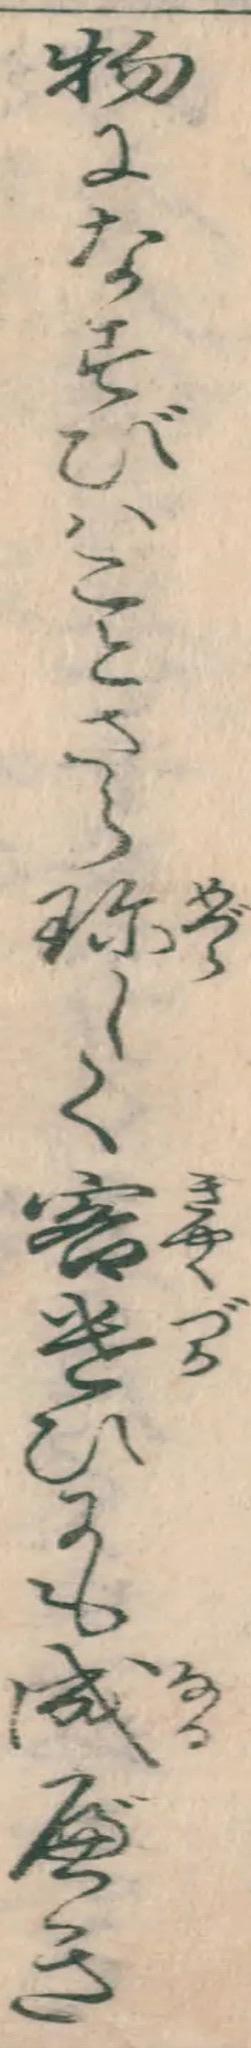物になすびはことさら珍しく客遣ひにも成べき
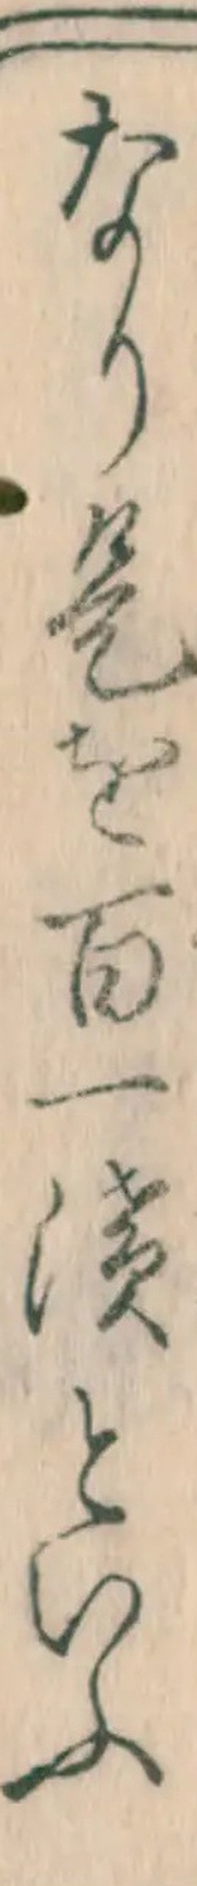なり是を百一漬といふ

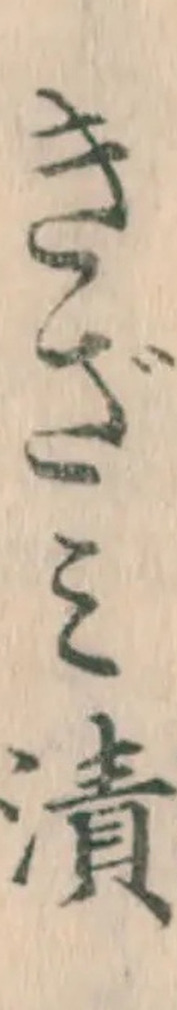きざみ漬
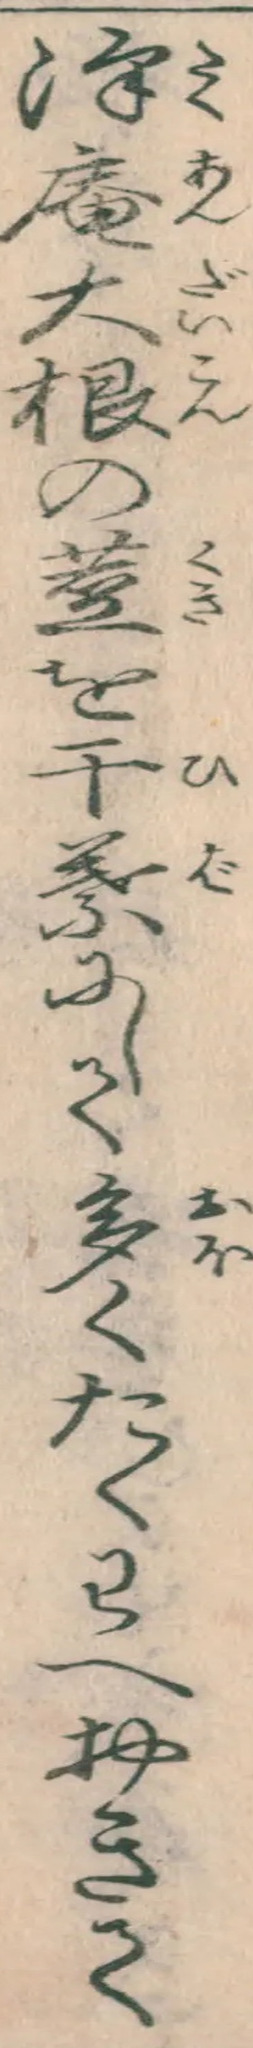沢庵大根の茎を干葉にして多くたくわへおきて
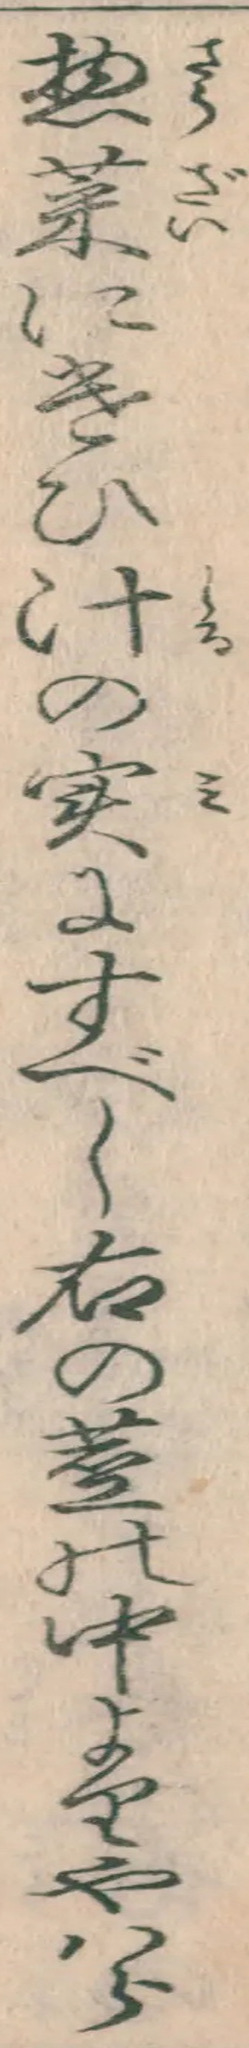惣菜に遣ひ汁の実にすべし右の茎の中よりやはら
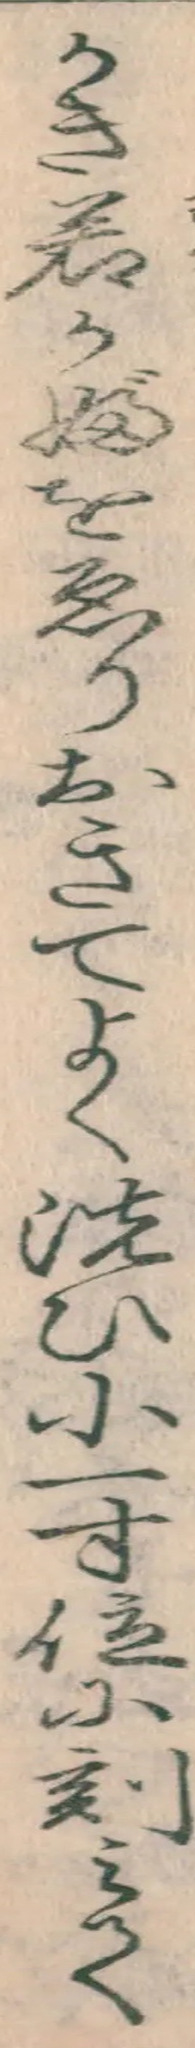かき若かぶをゑりおきてよく洗ひ小一寸位に刻みて
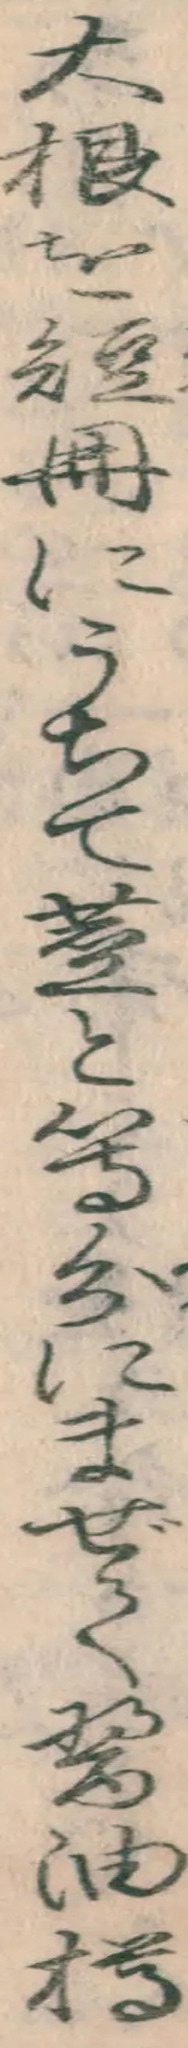大根を短冊にうちて茎と等分にまぜて醤油樽
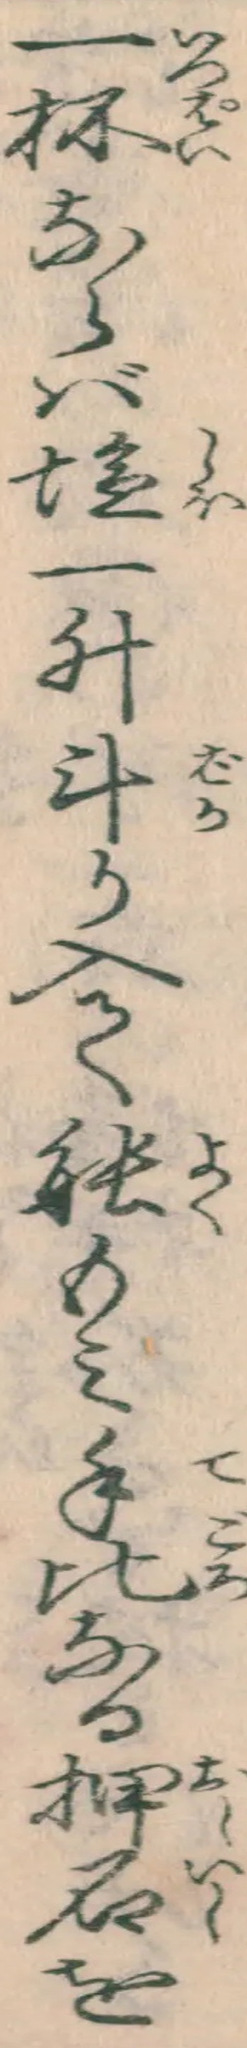一杯ならば塩一升斗り入て能もみ手比なる押石を
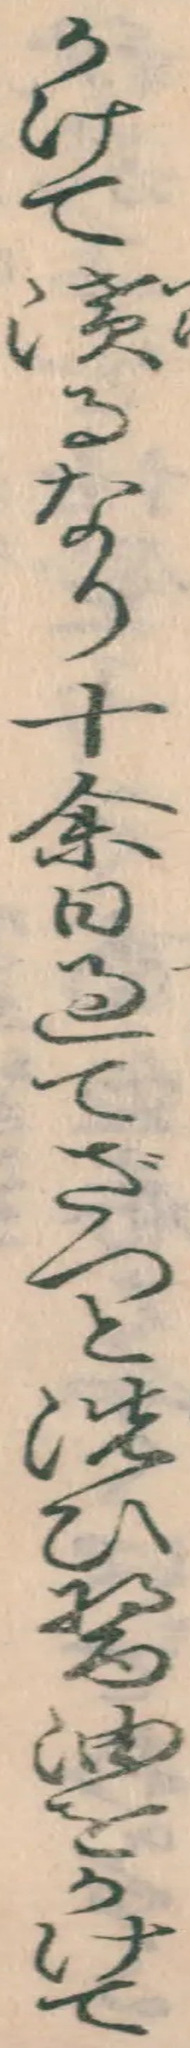かけて漬るなり十余日過てざつと洗ひ醤油をかけて
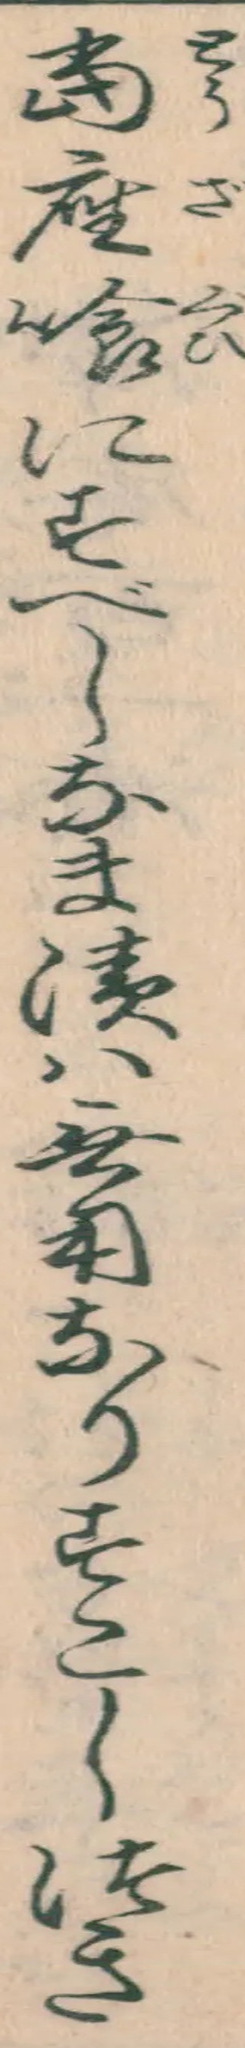当座喰にすべしなま漬は無用なりすこしつき
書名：四季漬物鹽嘉言
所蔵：国立国会図書館 National Diet Library, JAPAN
